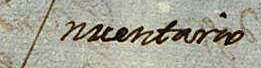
Jnuentario
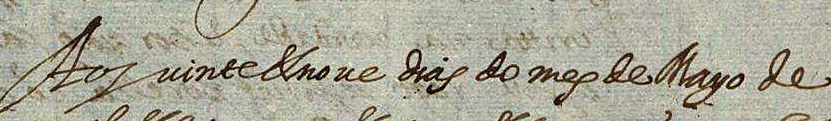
Aos uinte & noue dias do mes de Mayo de
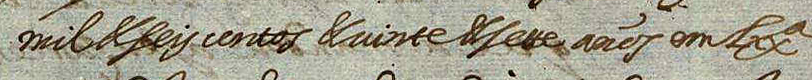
mil & seiscentos & uinte & sette anōs em Lxxa
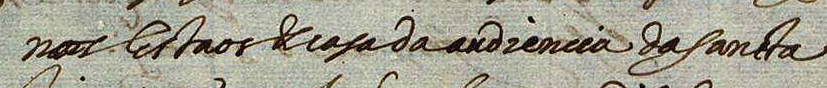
nos Estaos & casa da audiencia da sancta
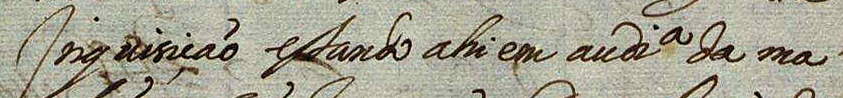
Jnquisição estando ahi em audia da ma
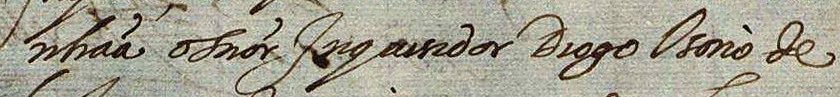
nhaã o sno̅r Jnquisidor Diogo Osorio de
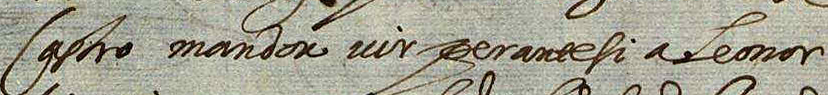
Castro mandou uir perante si a Leonor
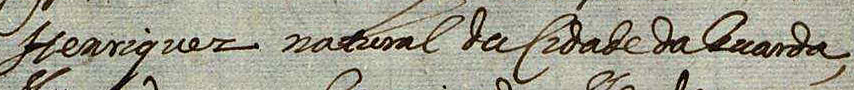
Henriquez natural da Cidade da Guarda,
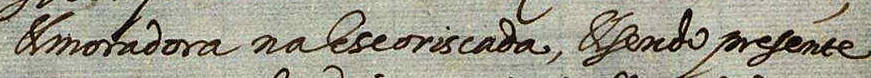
& moradora na Escoriscada, & sendo presente
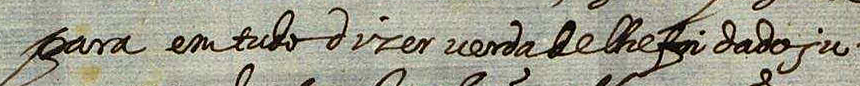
para em tudo dizer uerdade lhe foi dado ju
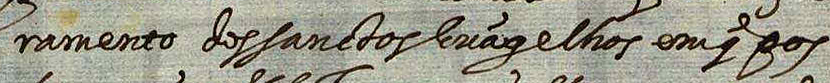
ramento dos sanctos Euāgelhos em q̄ pos
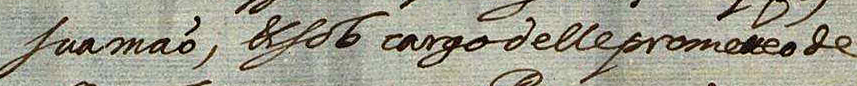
sua maõ, & sob cargo delle prometteo de
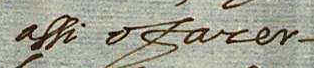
assi o fazer
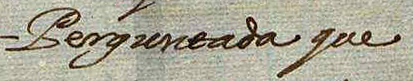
Perguntada que
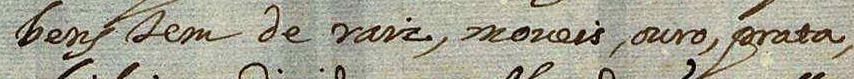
bens tem de raiz, moueis, ouro, prata,
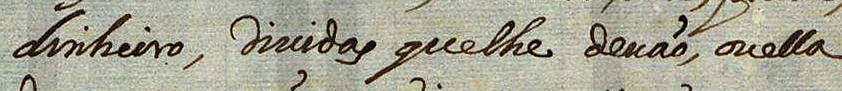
dinheiro, diuidas que lhe deuaõ, ou ella
